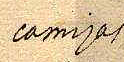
camizas
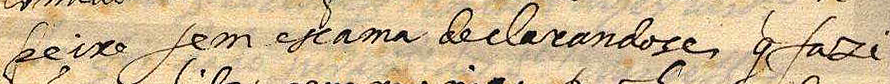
peixe sem escama declarandose q̄ fazi
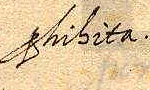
ꝓhibita.
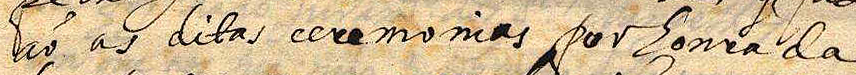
aõ as ditas ceremonias por honrada
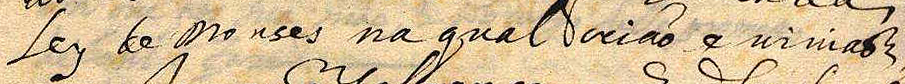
Ley de Mouses na qual criaõ e uiuiaõ
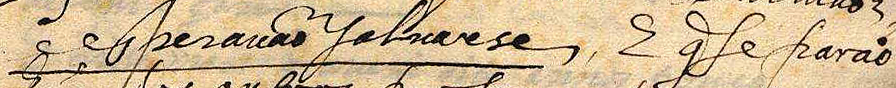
q̄ esperauão saluarse, E q̄ se fiaraõ
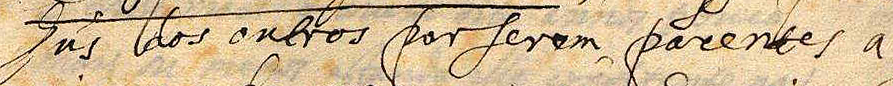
hūs dos outros por serem parentes a
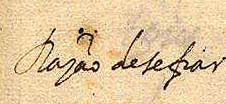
Razaõ de se fiar
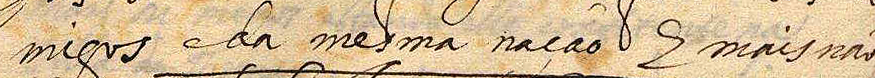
migos e da mesma nação E mais naõ
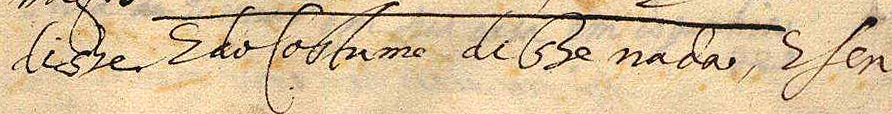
disse. E do Costume disse nada, E sen
